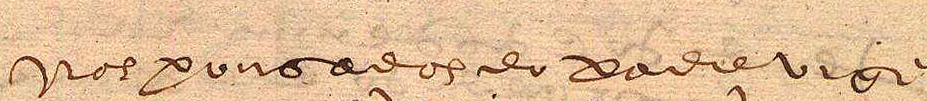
nas pousadas do padre vigr.o
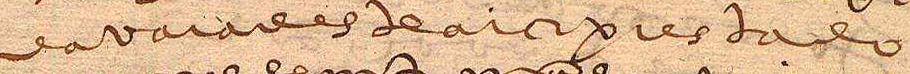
tavares do arciprestado
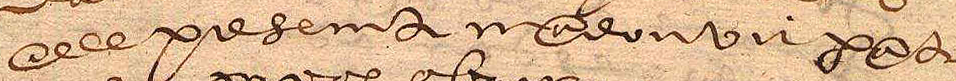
elle presemte mādou vir ꝑāte
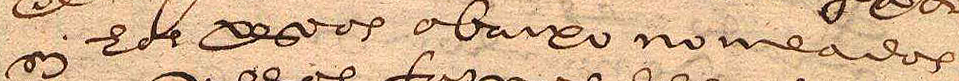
sy has pesoas abaixo nomeados
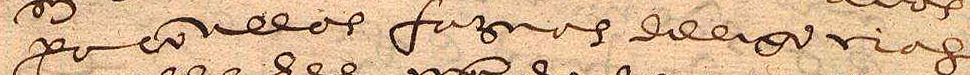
ꝑa cō ellas fazer as dilligēcias
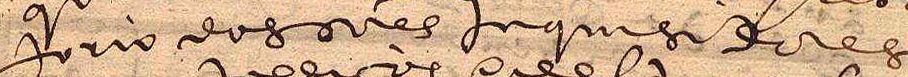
torio dos sor̄es Jnquisidores
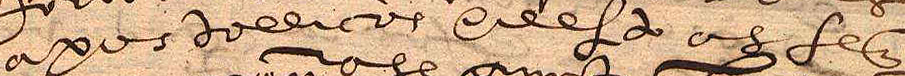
apostollicos e defto as fez̄
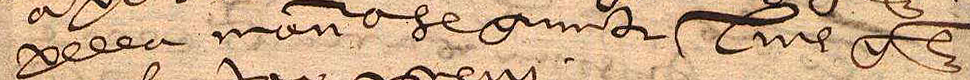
pella manra seguinte luis gl̄z
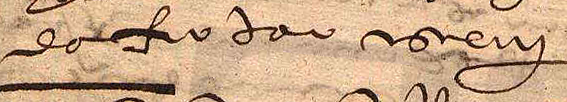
da frota o escreuj
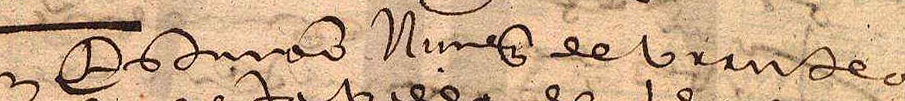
item Esteuaõ Nunez de vimte a
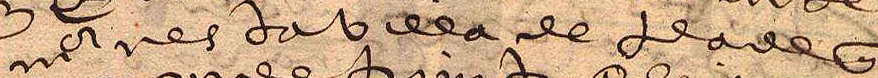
mor nesta villa de Jdade q̄
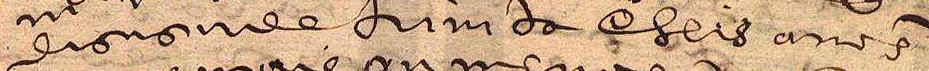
dise ser de trimta e seis anos̄
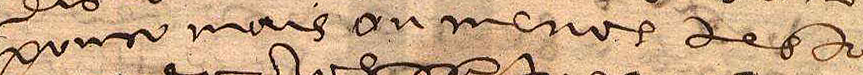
pouco mais ou menos testa
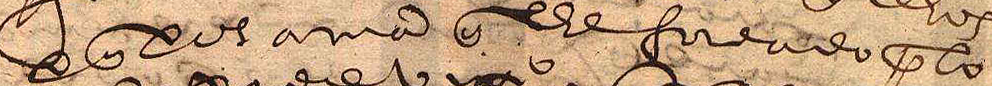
ē q̄ pos a mā q̄ lhe foi dado p̄lo
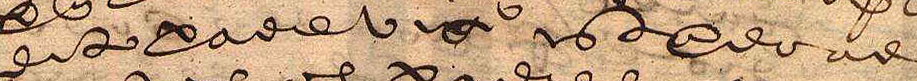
dito padre vigo estādo ad
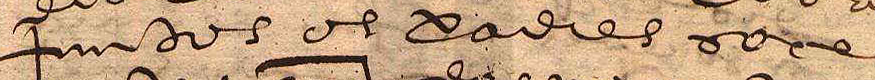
Juntos os padres sacer
